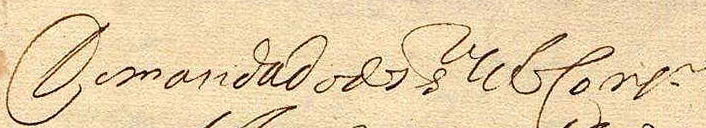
De mandado dos sres do Cons.o
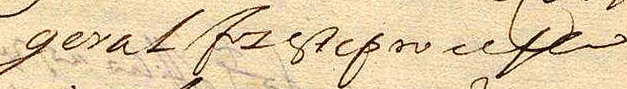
geral fiz este processo
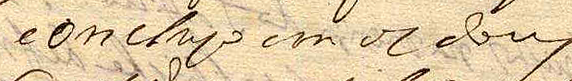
concluzo em os dous
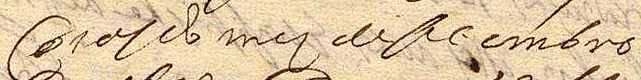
dias do mes de setembro
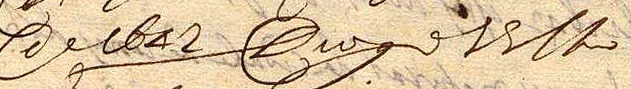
de 1642 Diogo Velho
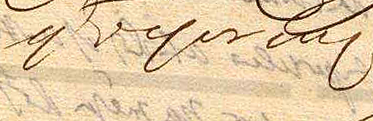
q̄ o escreuj
